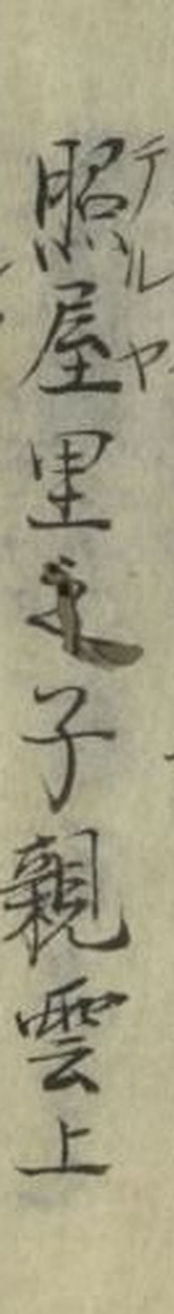楽師照屋里之子親雲上
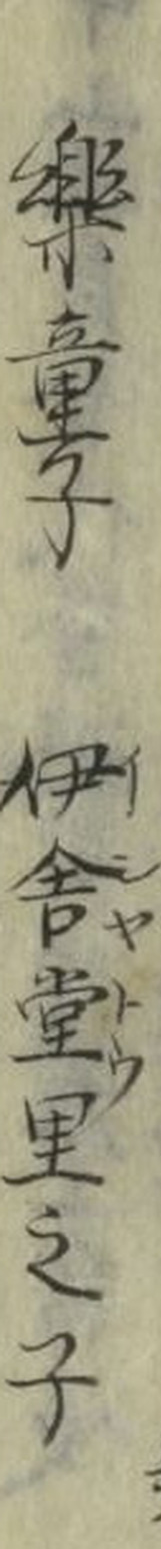楽童子伊舎堂里之子
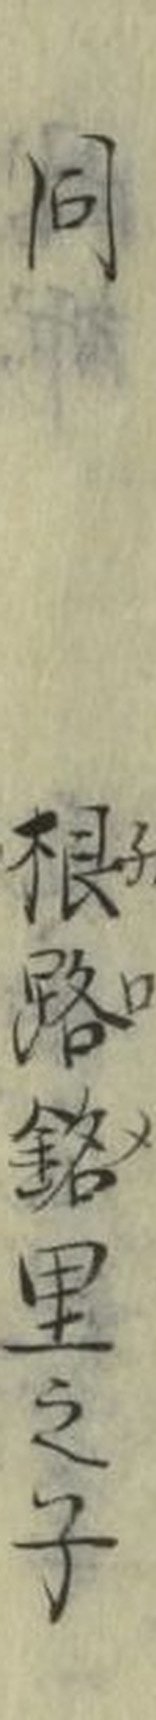同根路銘里之子
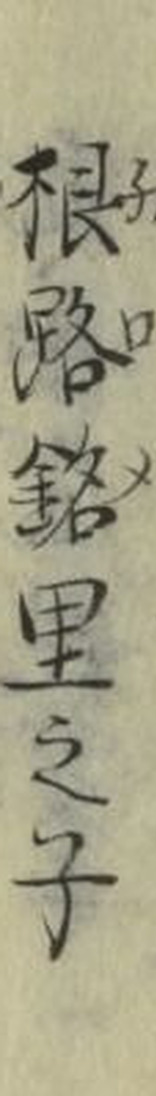同根路銘里之子
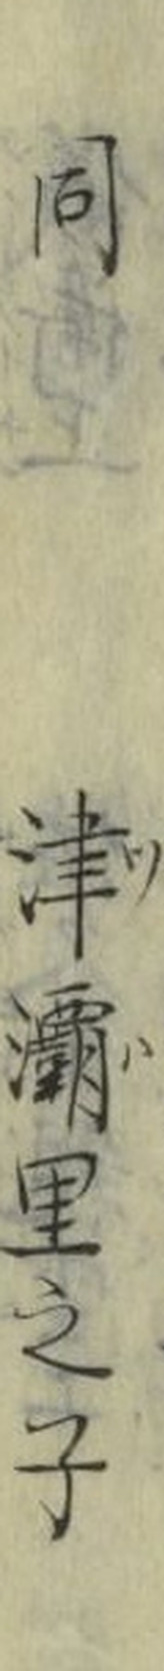同津灞里之子
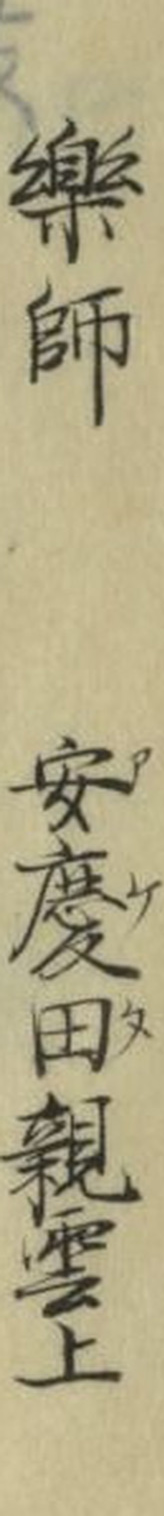楽師安慶田親雲上
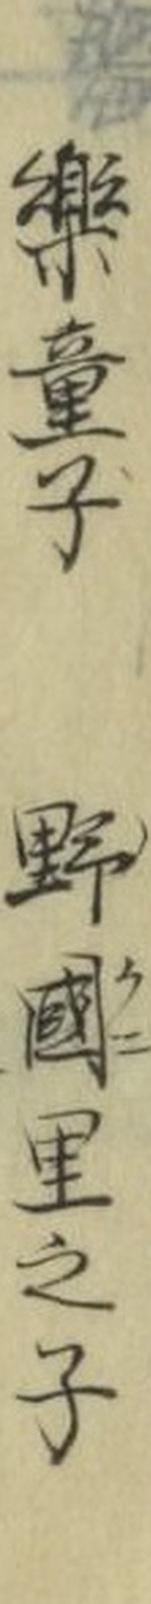楽童子野国里之子
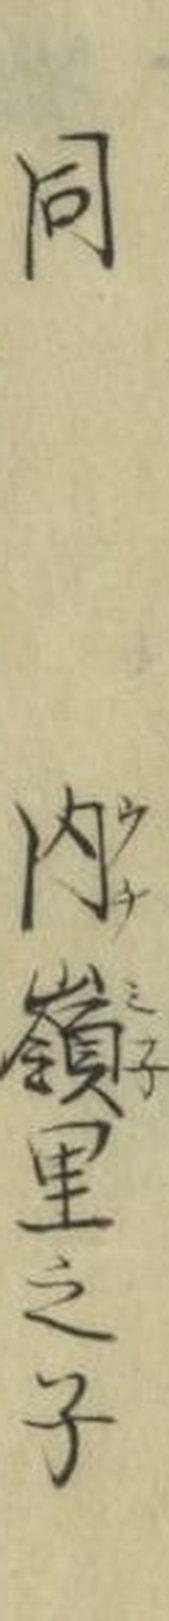同内嶺里之子
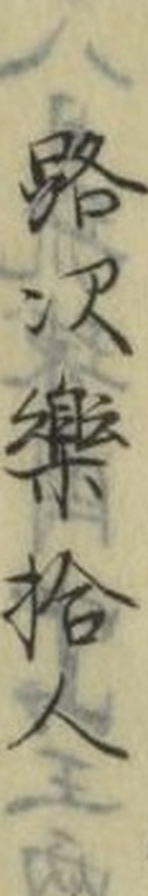路次楽拾人
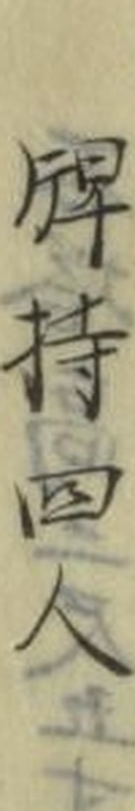牌持四人
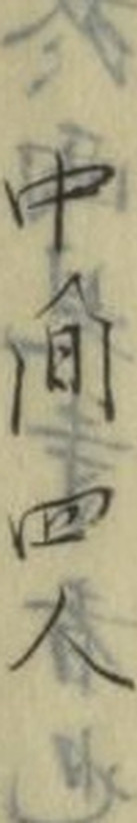中間四人
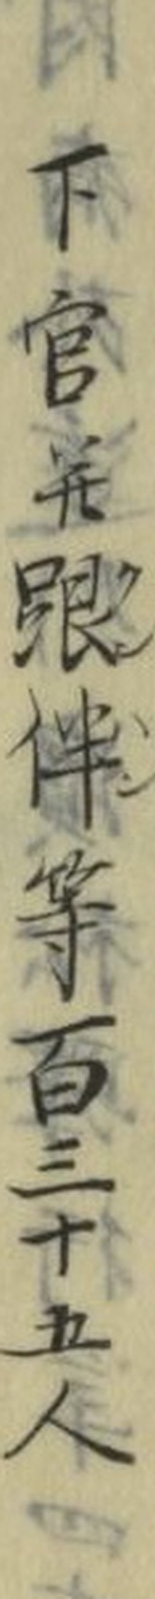下官幷跟伴等百三十五人
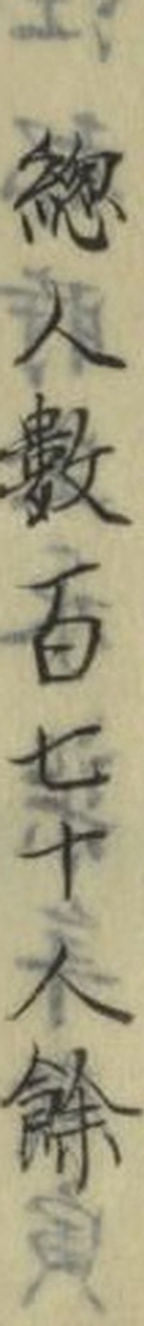総人数百七十人余
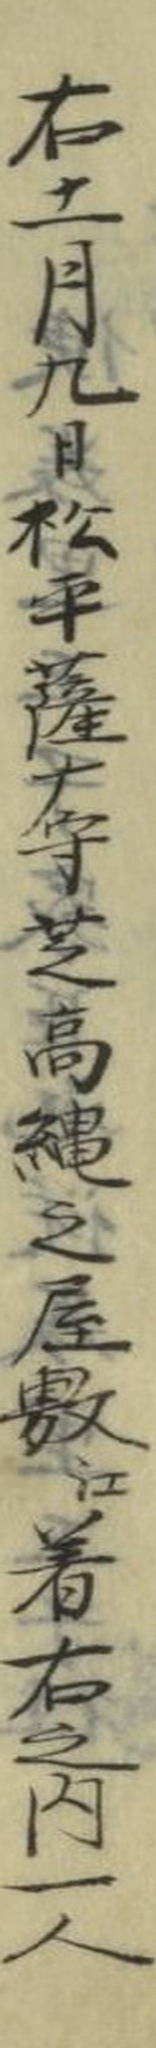右十一月九日松平薩摩守芝高縄之屋敷え着右之内一人
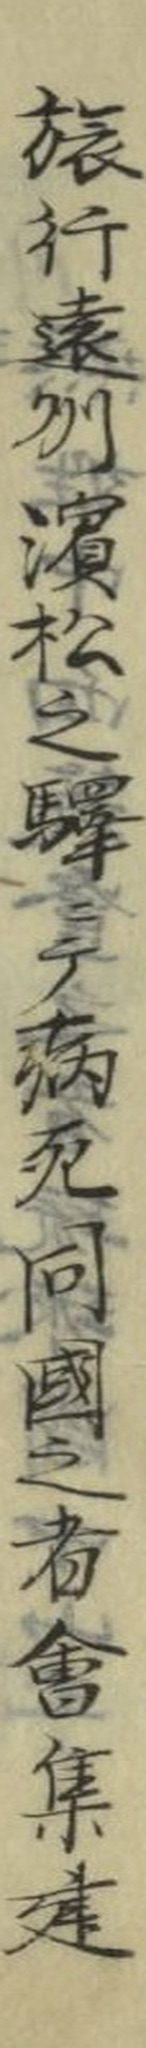旅行遠州浜松之駅にて病死同国之者会集建
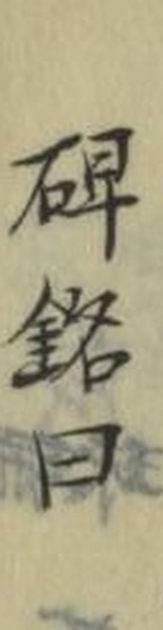碑銘曰
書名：宝永七庚寅年琉球国来聘使日記
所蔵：University of the Ryukyus Library
